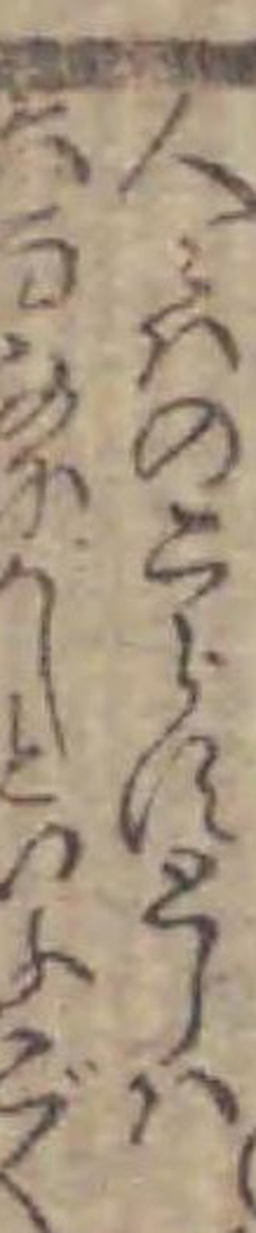六百なにかしといふごく
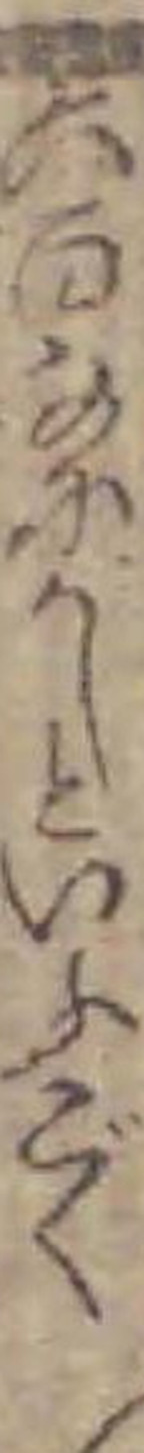六百なにかしといふごく
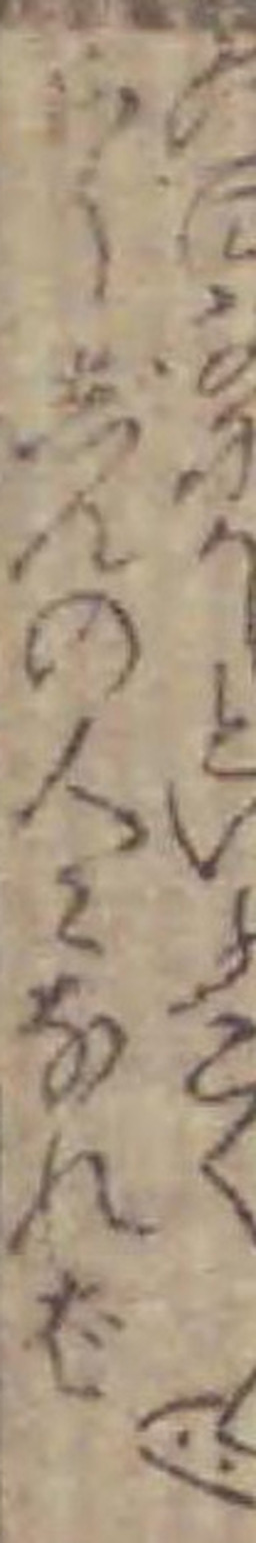らうじんの人々なれば
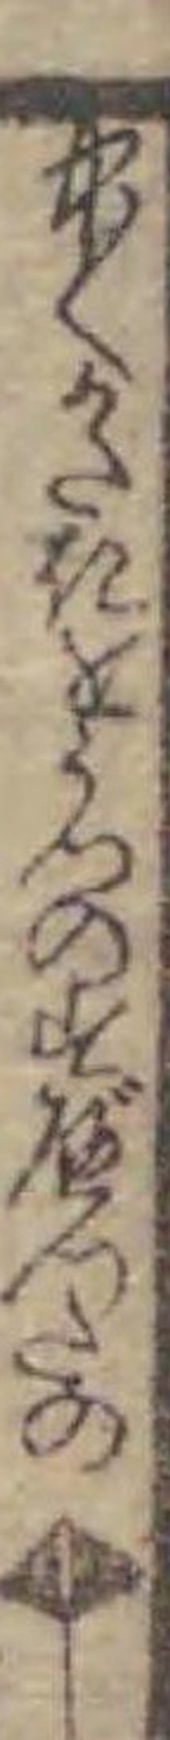中〳〵かたきをうつのすべつたの
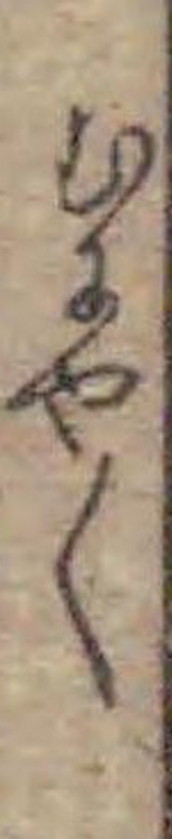むにや〳〵
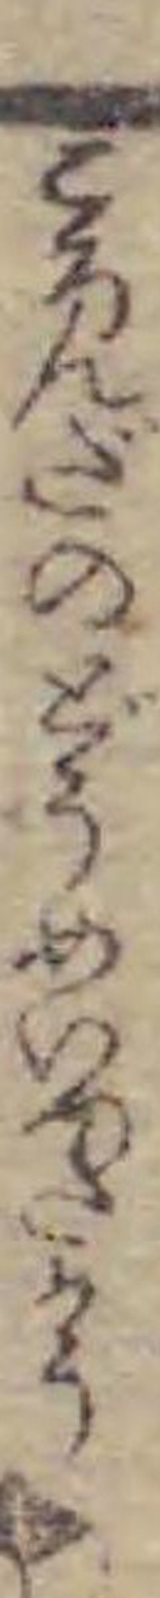ころんだのどうめいつたかう
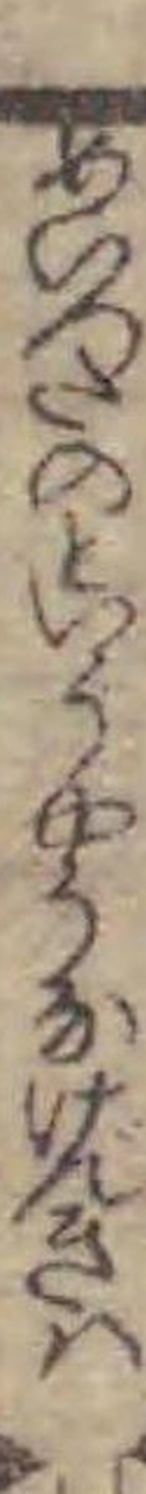めいつたのというやうなげんきは
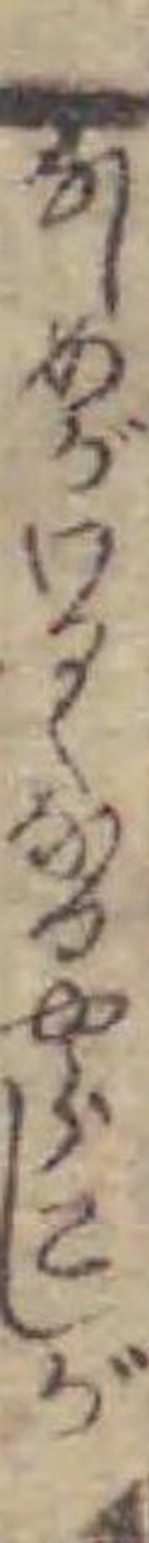なしめがわるくなるやらこしが
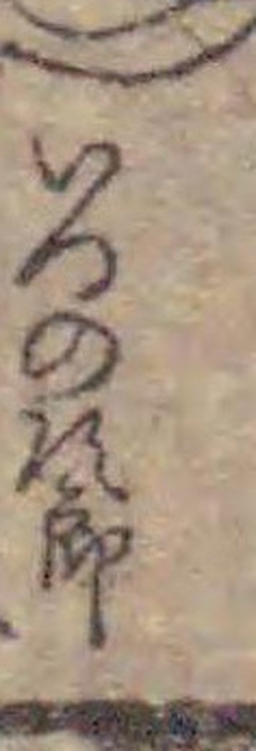いつの次郎
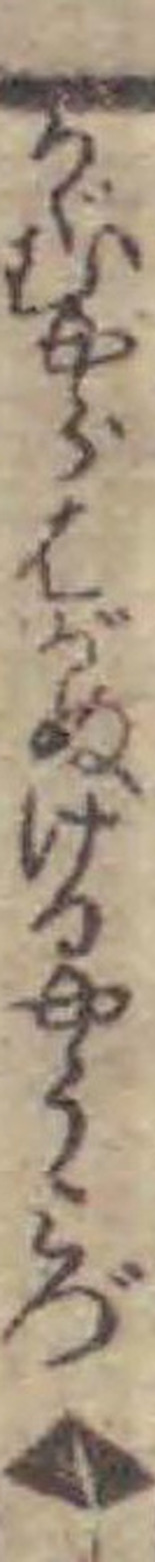かゞむやらはがぬけるやうみづ
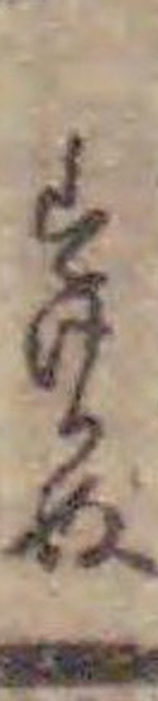すけかぬ
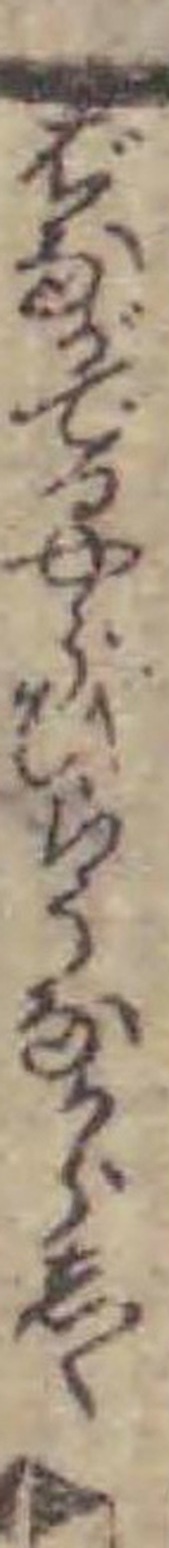ばながでるやらびらうなからしゝ
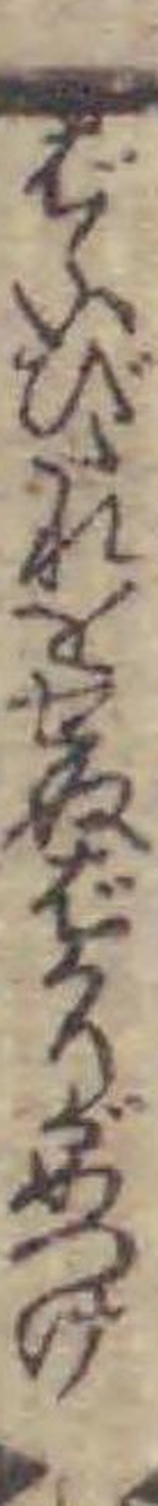ばゝいびたれをせぬばかりがめつけ
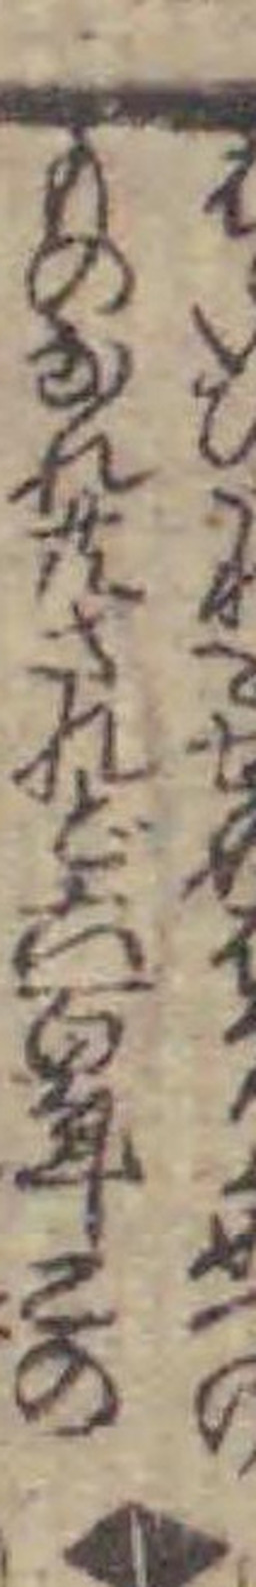ものなれ共されど六百年この
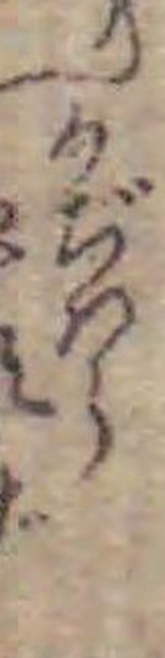かぢはら
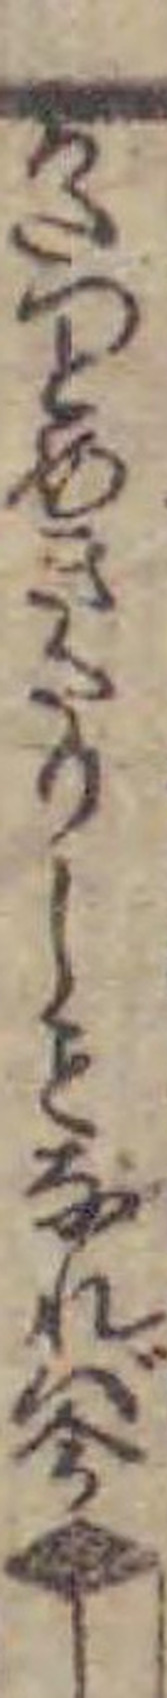かたつとめきたりしことなれば今
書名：年寄之冷水曽我 : 3巻
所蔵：国立国会図書館 National Diet Library, JAPAN
